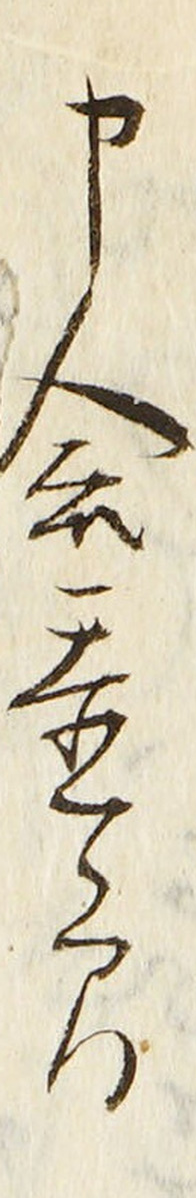申含置候間
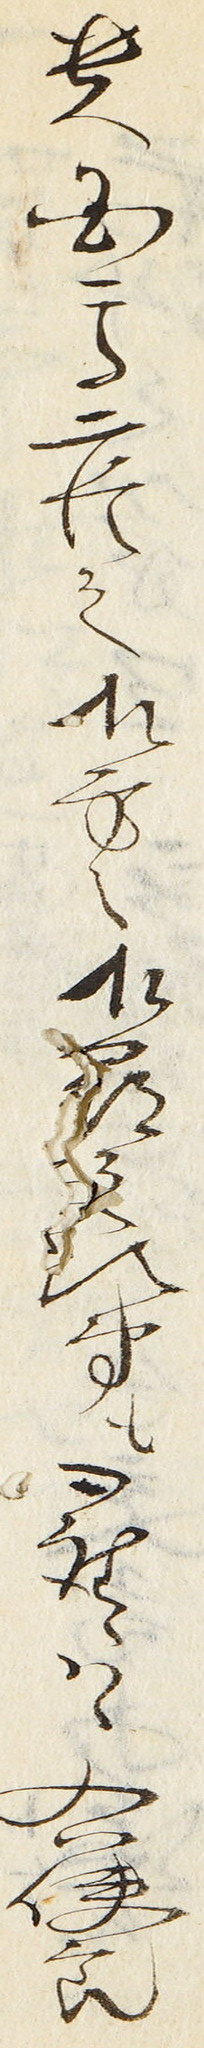貴国高官之御方之御尋之次第も御座候はゝ右使節
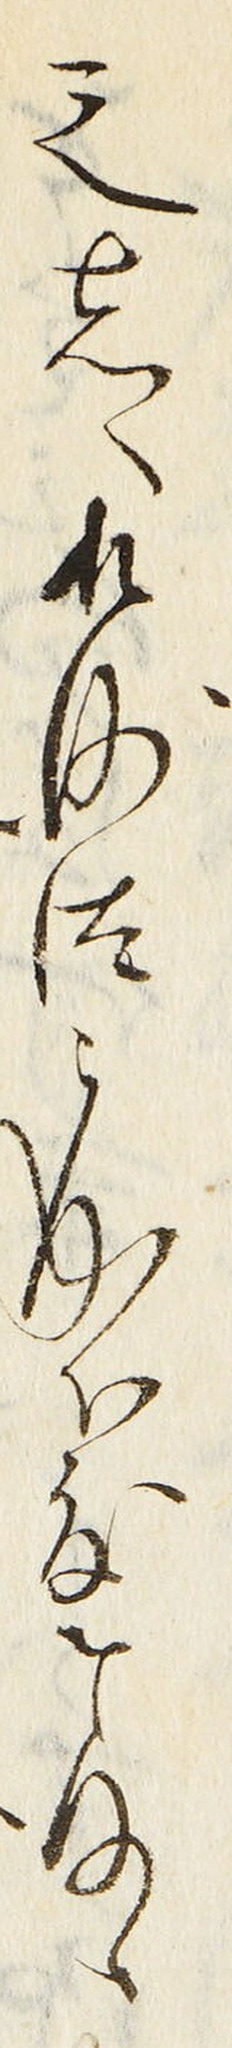之者へ御沙汰被成下度奉存候
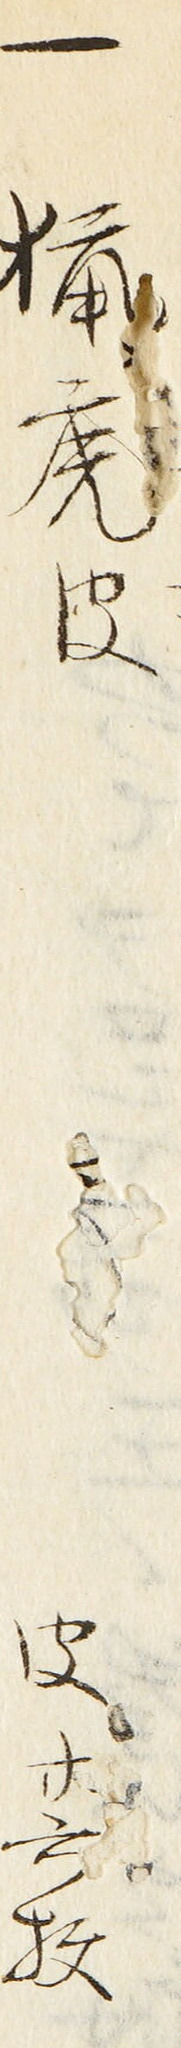一猟虎皮皮等六枚
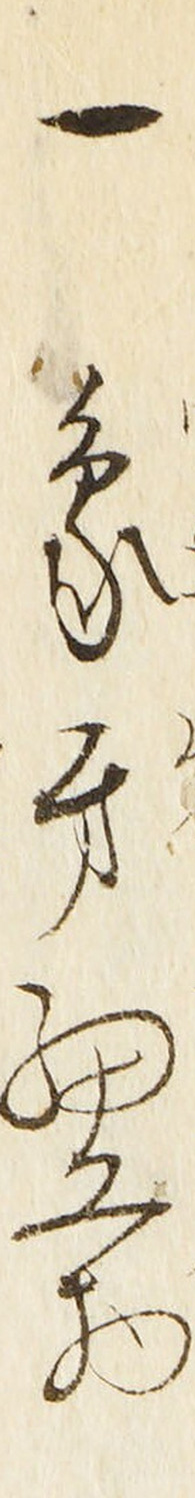一象牙細工物
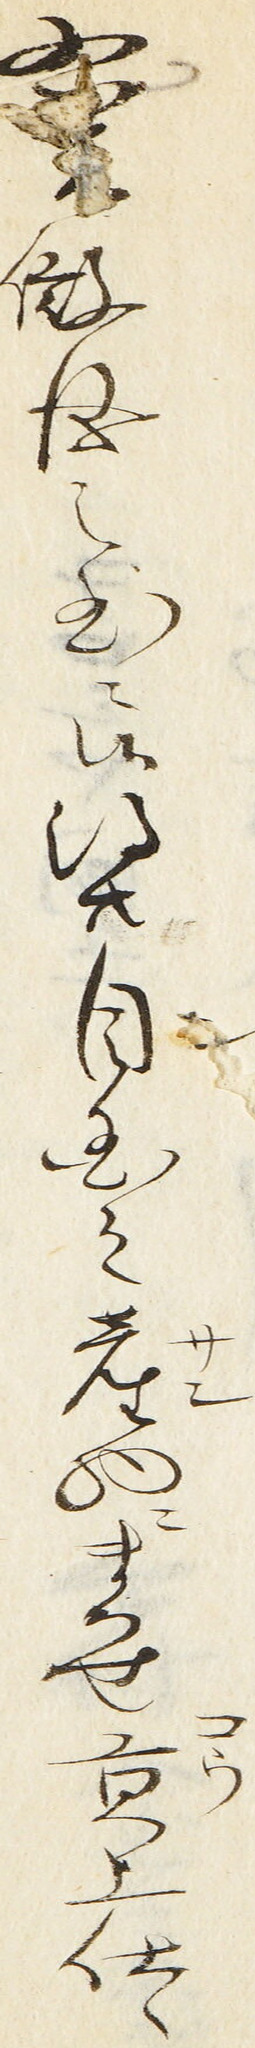右は微儀之至に候得共自国之産物にまかせ貢上仕候
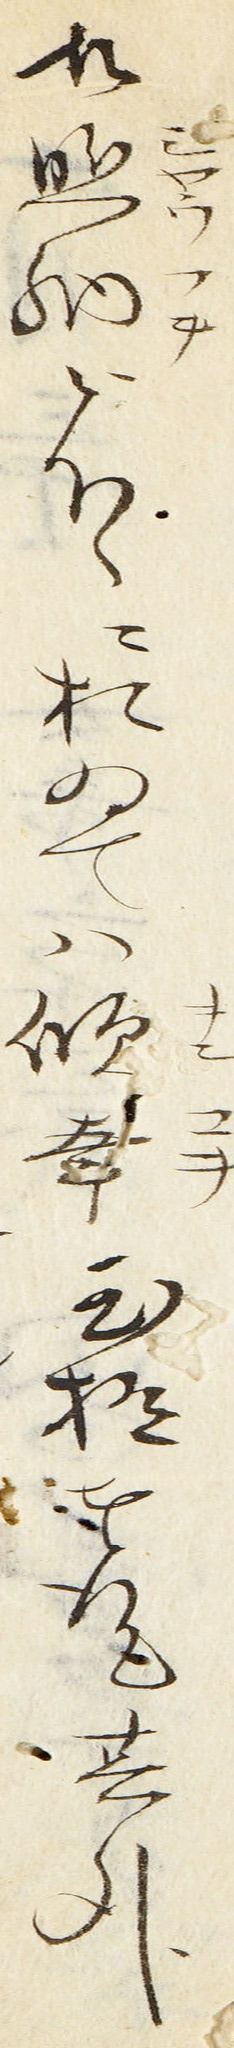御照納被下候におゐては欣幸至極奉存候其外
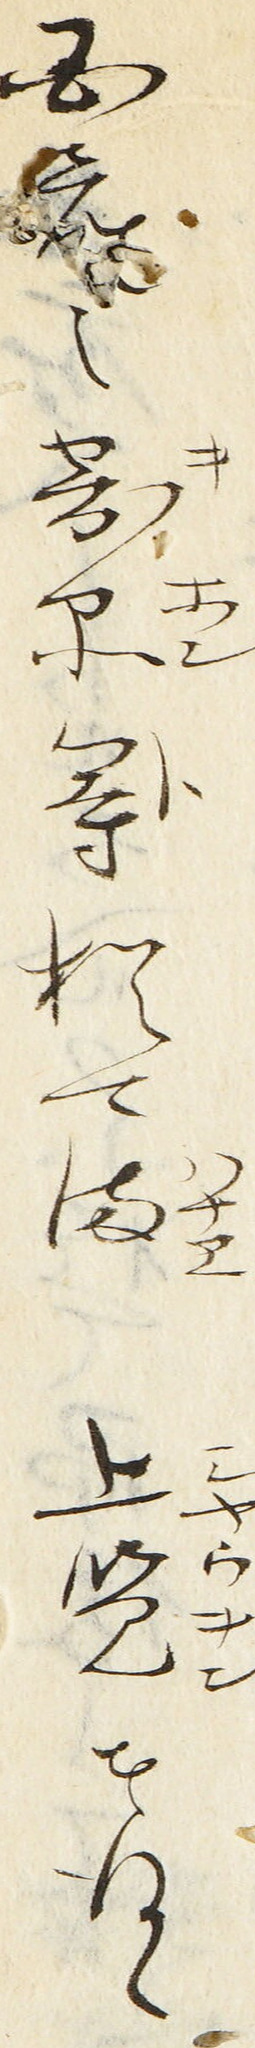国産之貴品等猶可備上覧奉存候

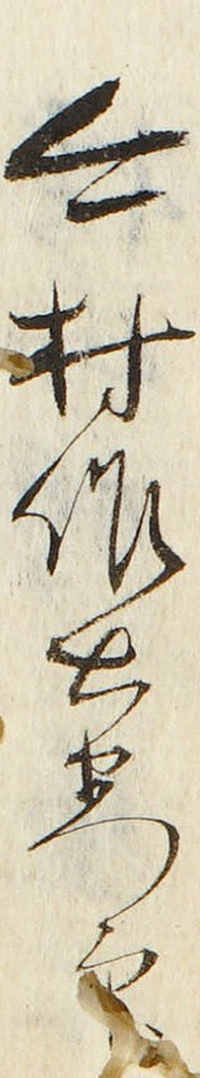今村作右衛門印
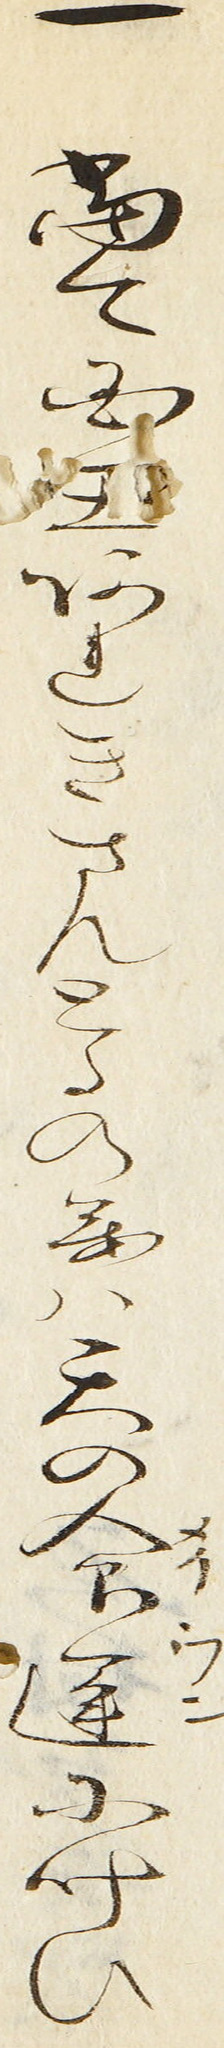一当今国王あれきさんとるの義は天の命運に叶ひ
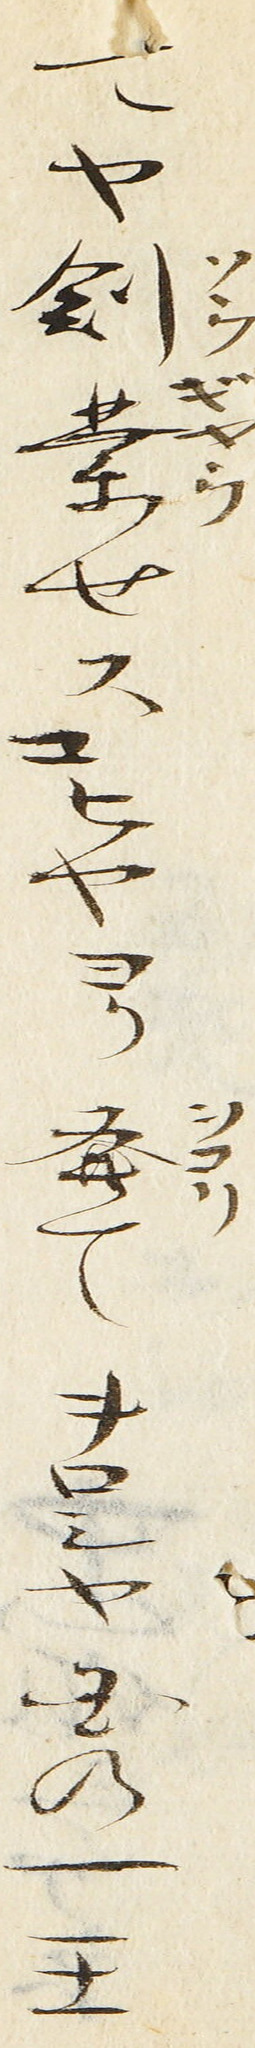てや創業セスコヒヤより発てヲロシヤ国の一王
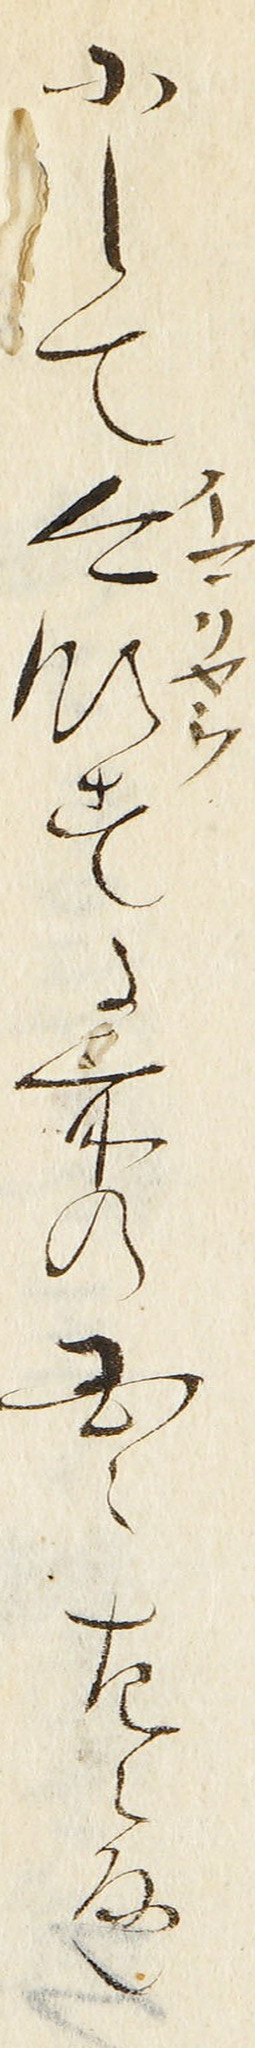にして今領する所の国々左之通
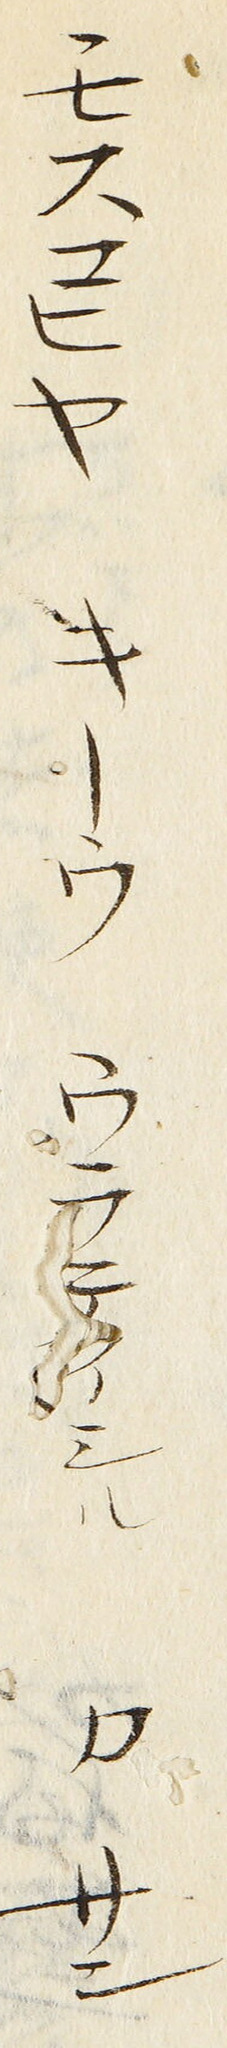モスコヒヤキーウウラテイミルカサン
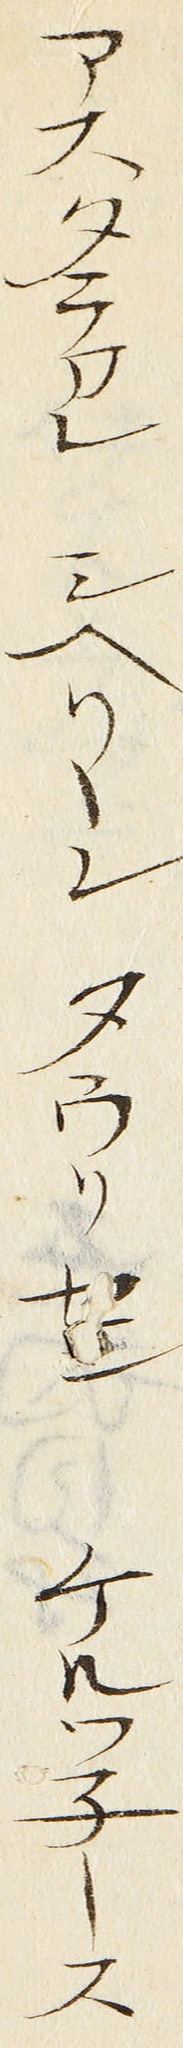アスタラカンシヘリーンタウリセンカルツ子ース
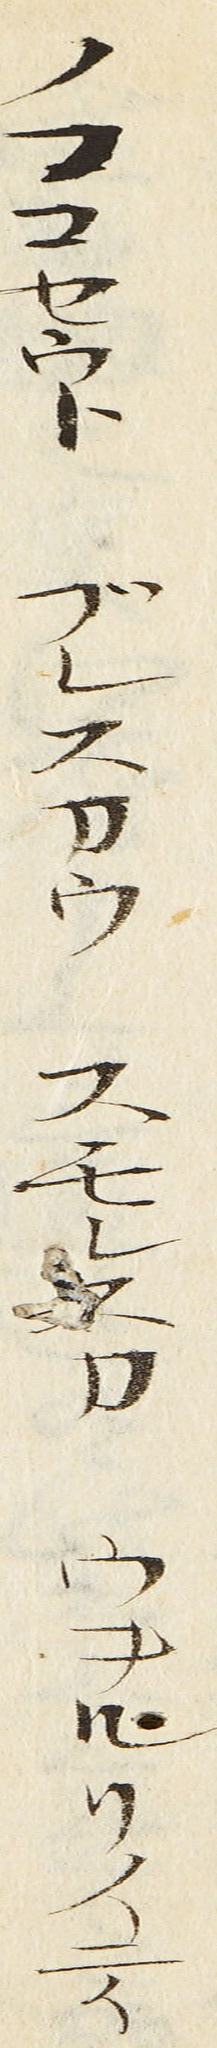ノフコセウトブレスカウスモレスカウヲルリイニイ
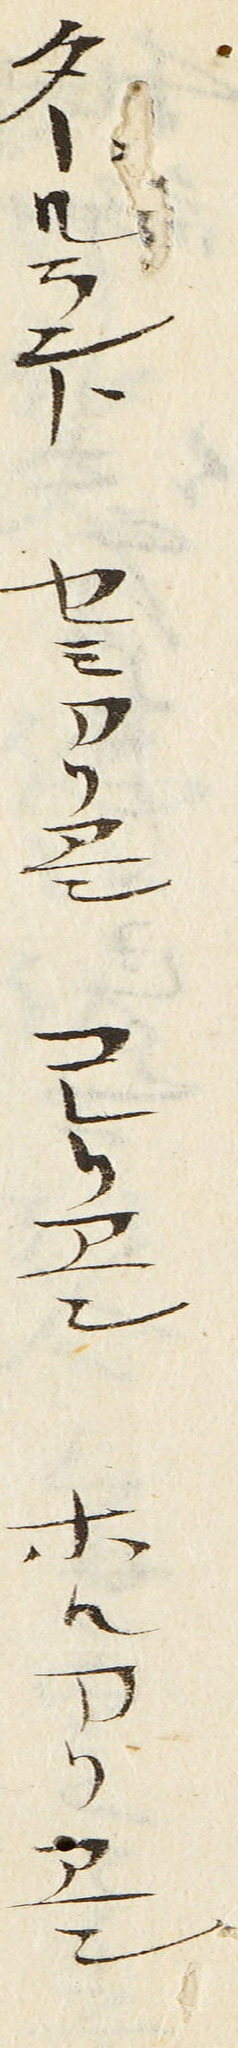タールラントセミカリヱンコレリヱンホルカリヱン
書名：魯西亜国舟渡来始末并日本流漂人異国遍歴之話（西洋欧羅巴州之内一）
